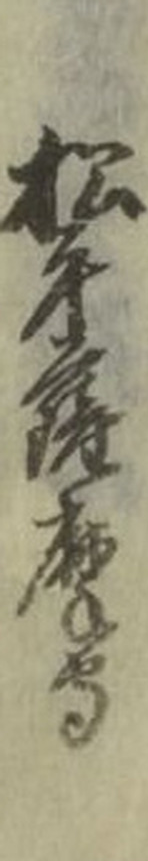松平薩摩守
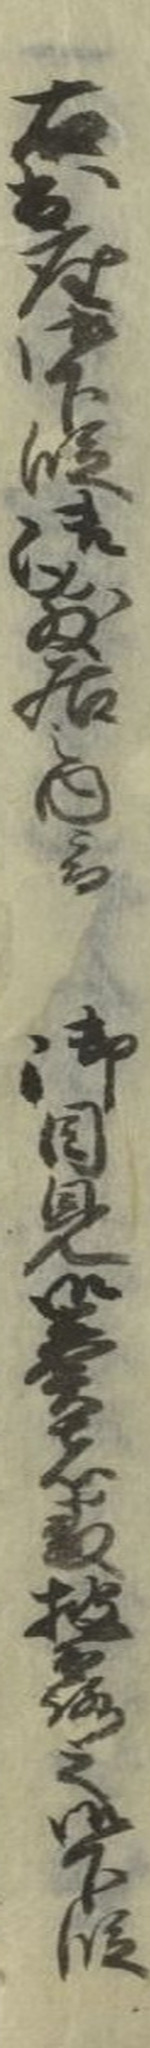右出座御下段御敷居之内に而御目見御奏者番披露之御下段
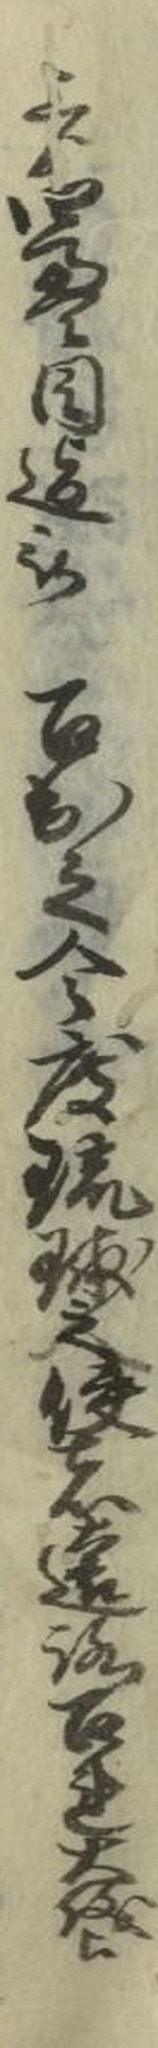上ゟ四畳目迠被召出之今度琉球之使者遠路召連大儀被
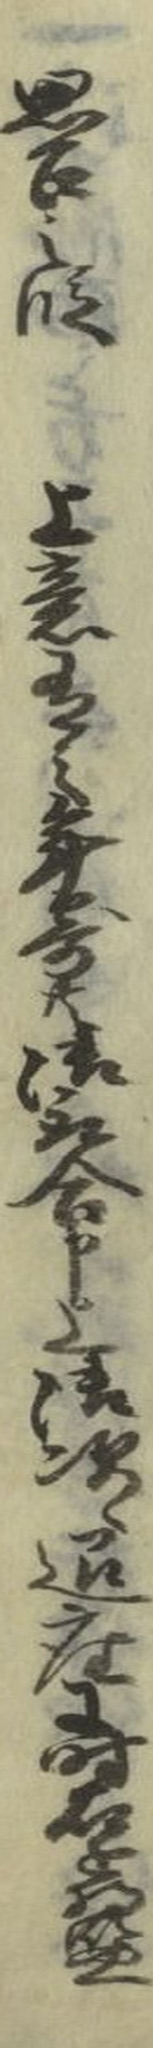思召之段上意有之年寄共御取合申上御次々退座時右近将監
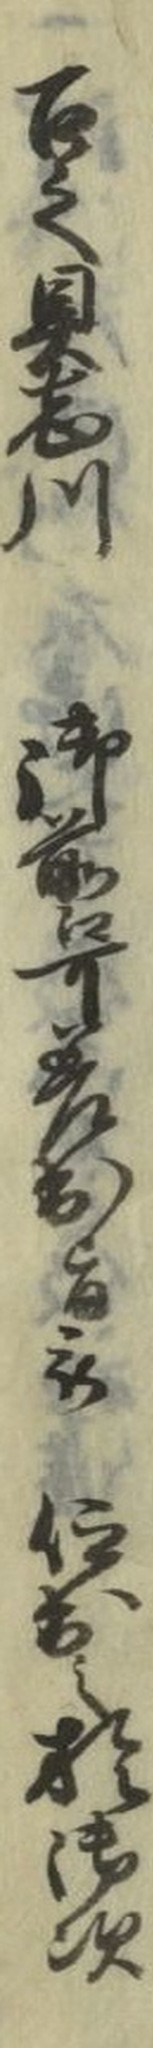召之具志川御前え可差出旨被仰出之権御次
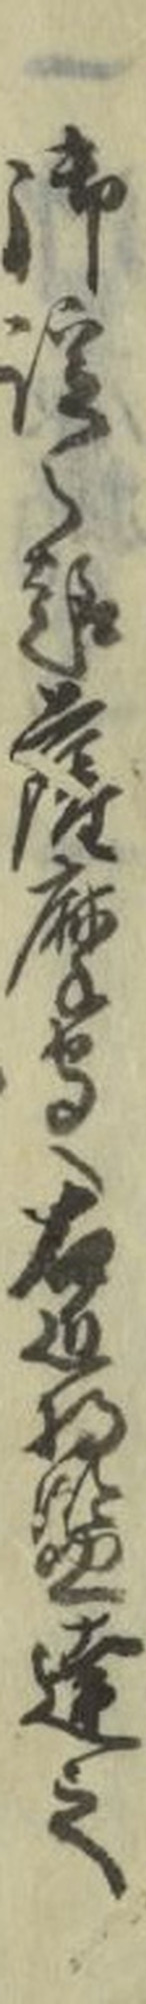御諚之趣薩摩守へ右近将監達之
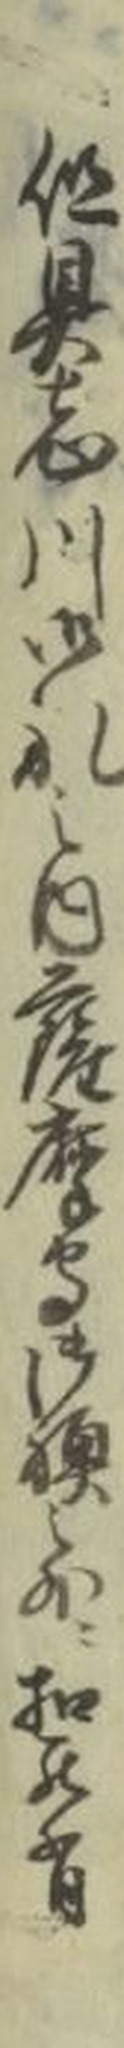但具志川御礼之内薩摩守御襖之外に扣罷有
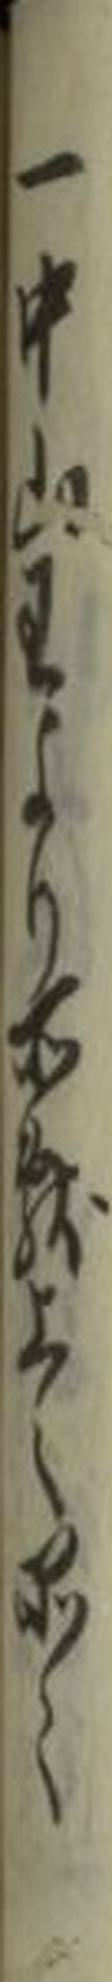一中山王より所献上之品々
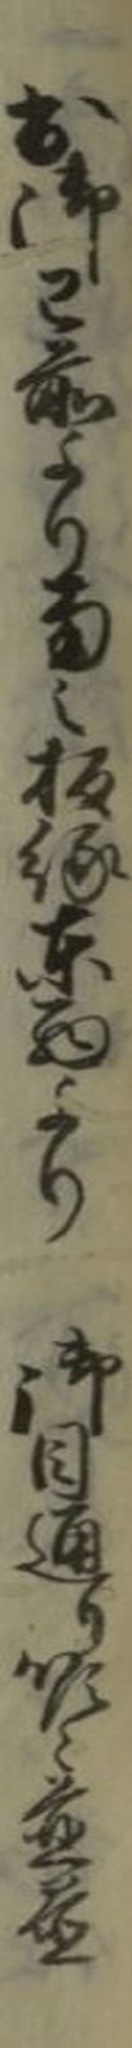出御已前より南之板縁東西より御目通り順々並置
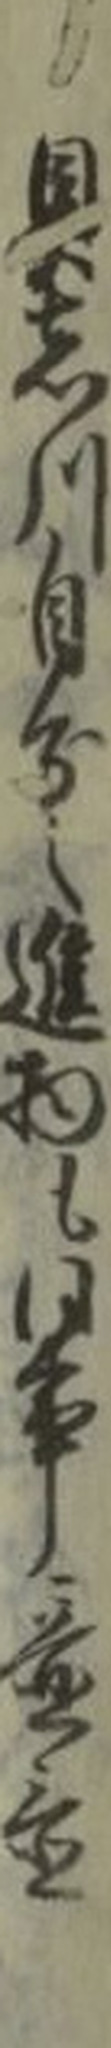具志川自分之進物も同事に並置
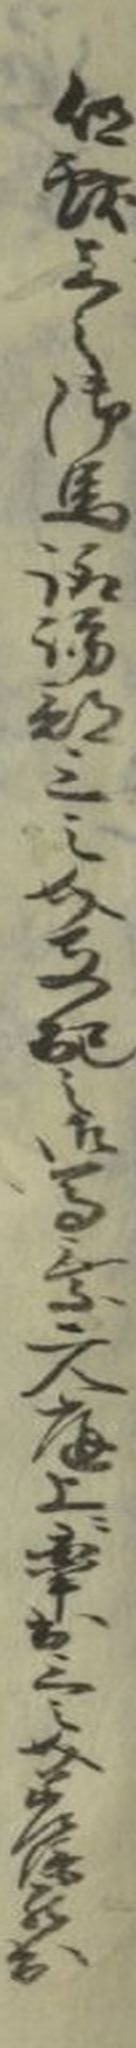但献上之御馬諏訪部三之介支配之御馬乗二人庭上に牽出三之介差添罷出
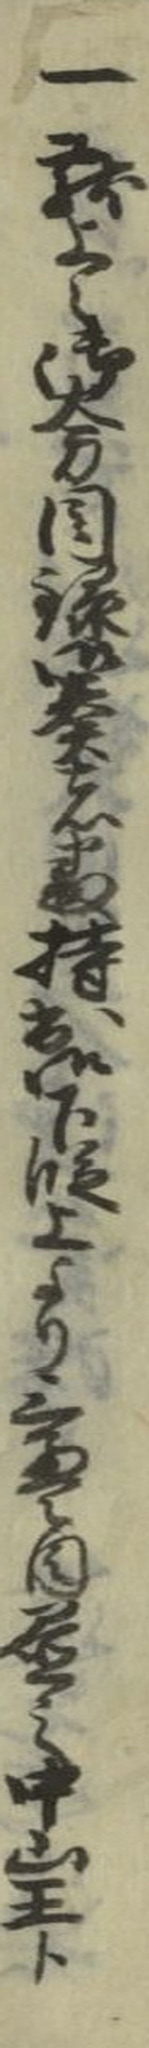一献上之御太刀目録御奏上番持出御下段上より三畳目置之中山王分
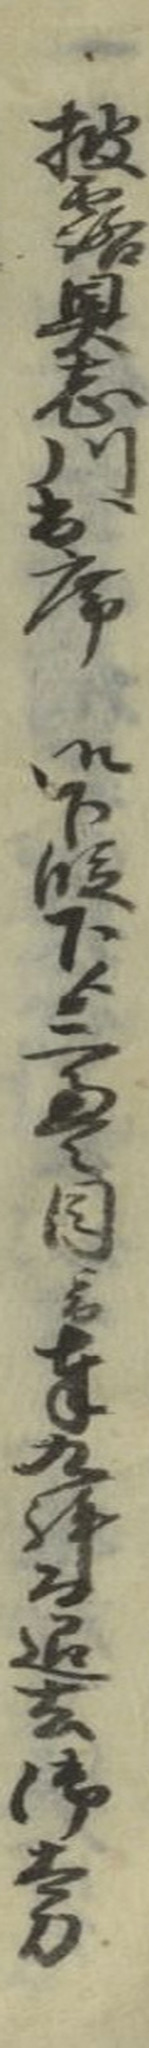披露具志川出席御下段下ゟ二畳目に而奉九拝而退去御太刀
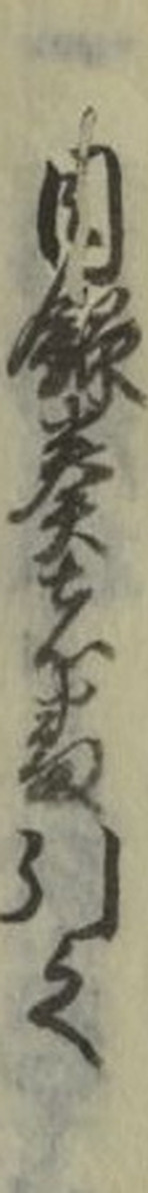目録奏者番引之
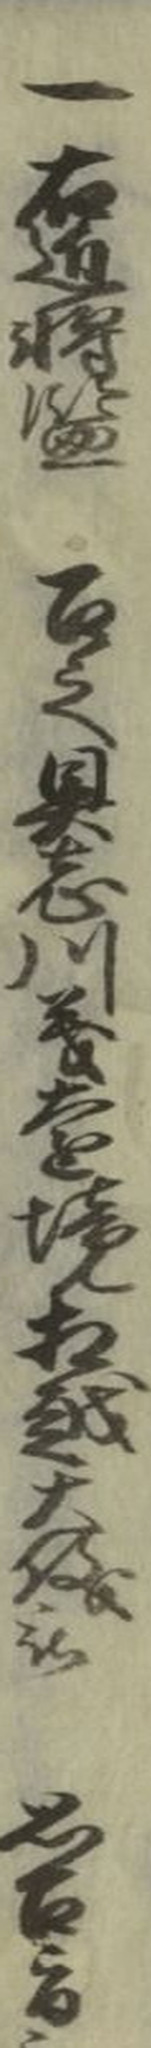一右近将監召之具志川義遠境相越大儀被思召旨被
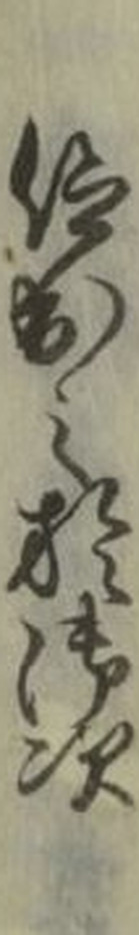仰出之於御次
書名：琉球人来朝之記
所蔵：University of the Ryukyus Library
